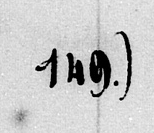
149.)
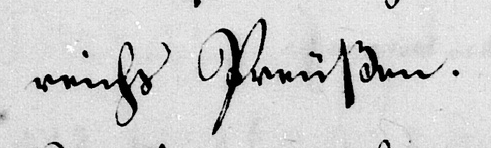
reichs Preußen.
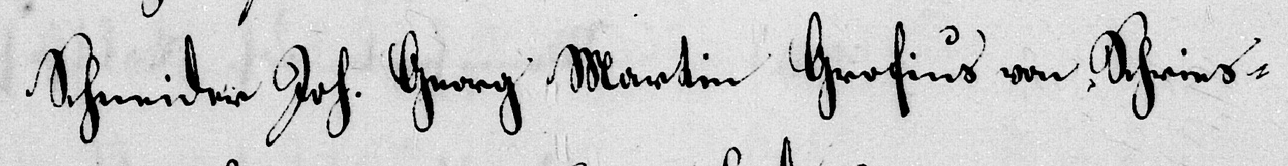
Schneider Joh. Georg Martin Grofius von Schries¬
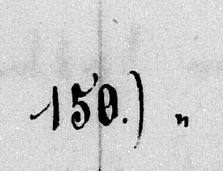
153.) “
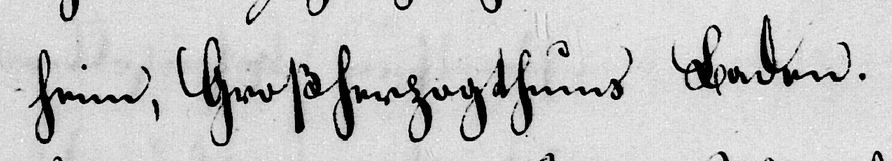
heim, Großherzogthums Baden.
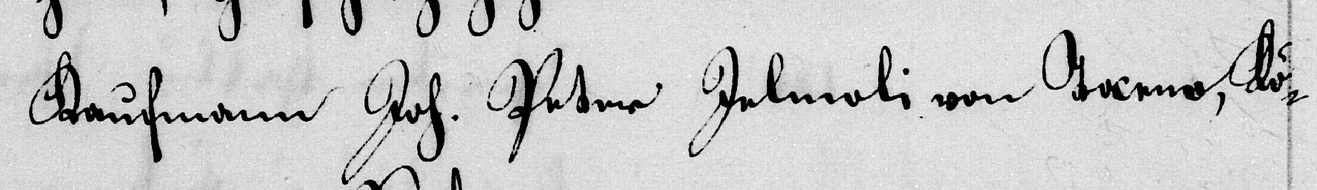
Kaufmann Joh. Peter Jelmoli von Toceno, Kö¬
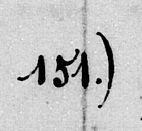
151.)
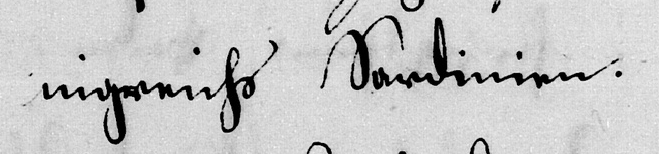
nigreichs Sardinien.
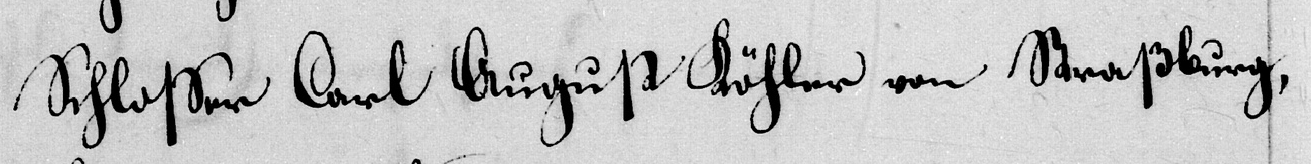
Schloßer Carl August Köhler von Straßburg,
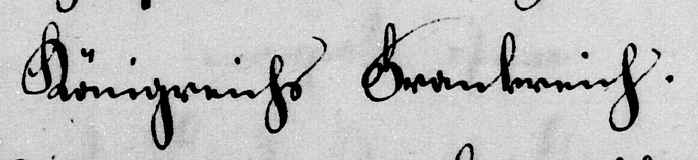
Königreichs Frankreich.
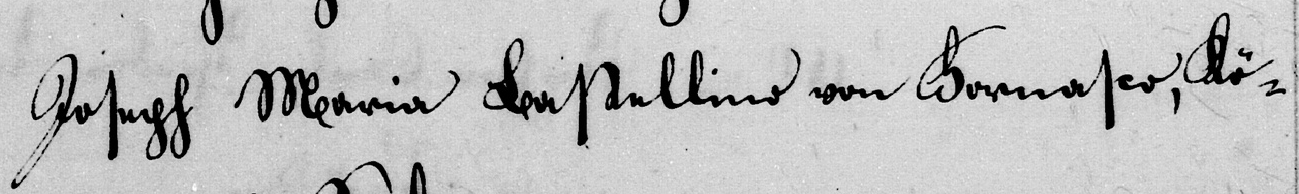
Joseph Maria Bastellino von Fornasco, Kö¬
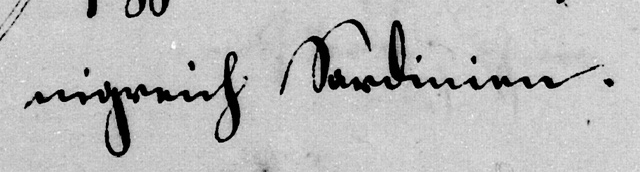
nigreich Sardinien.
